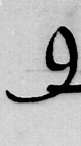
n¬
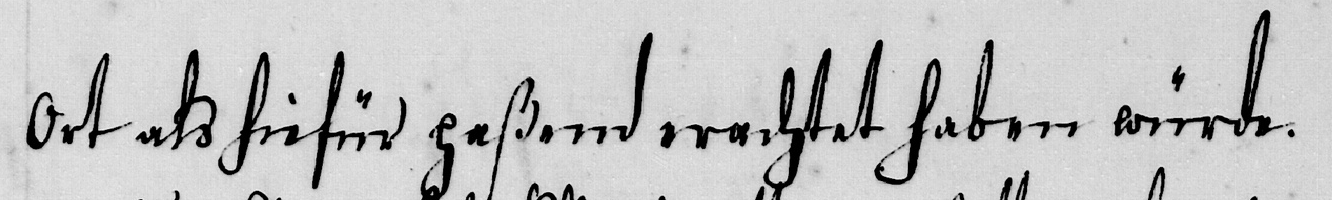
Ort als hiefür paßend erachtet haben würde.
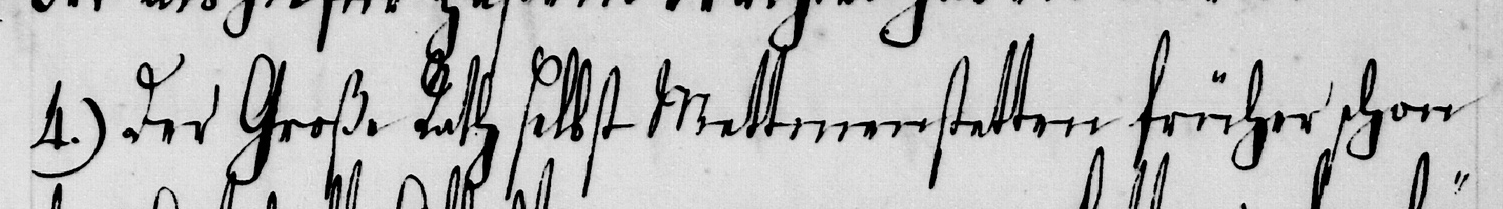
4.) Der Große Rath selbst Mettmenstetten früher schon
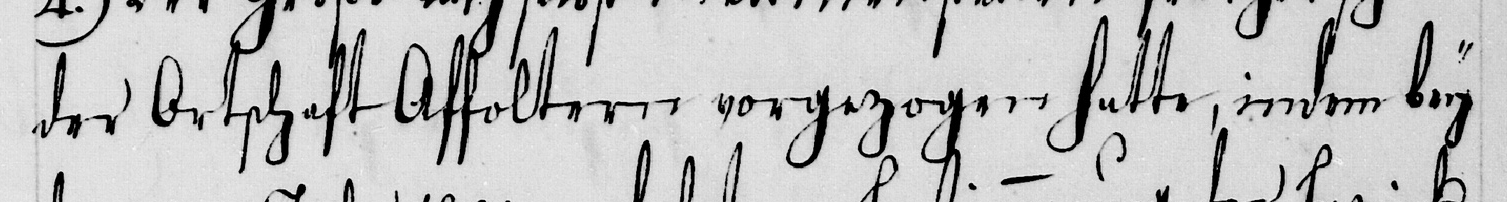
der Ortschaft Affoltern vorgezogen hatte, indem bey
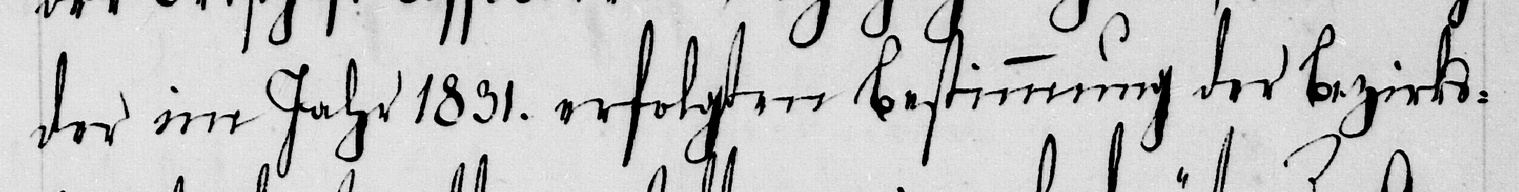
der im Jahr 1831. erfolgten Bestimmung der Bezirks¬
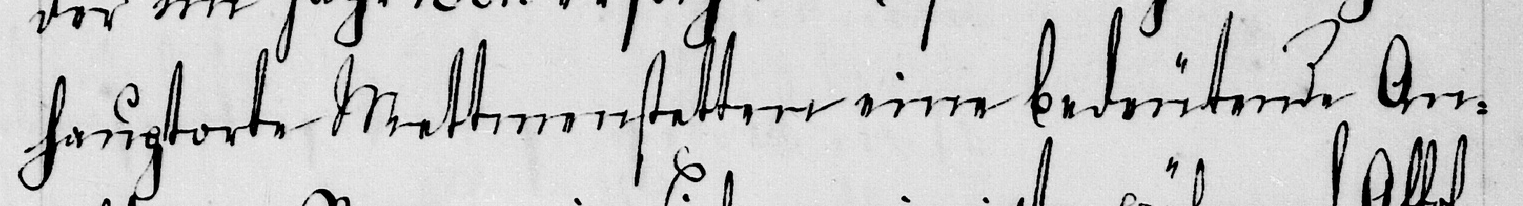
hauptorte Mettmenstetten eine bedeutende An¬
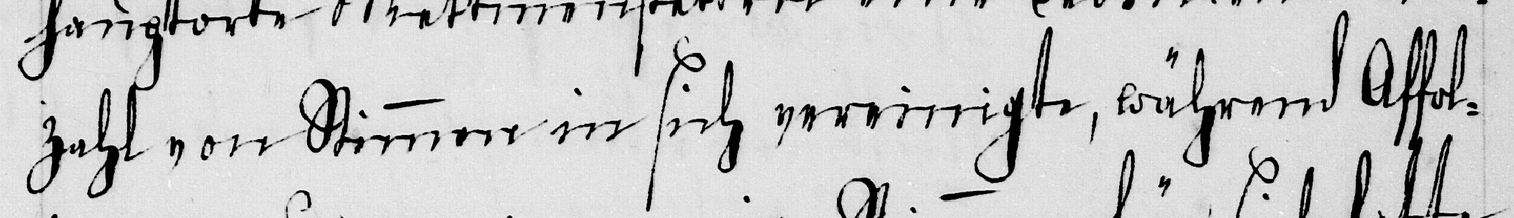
zahl von Stimmen in sich vereinigte, während Affol¬
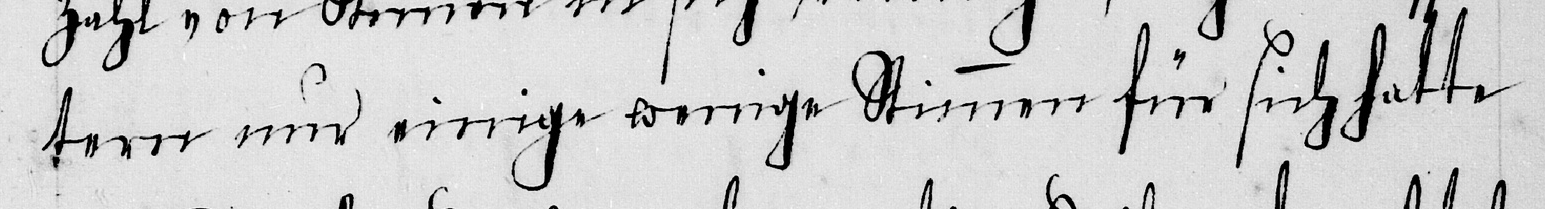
tern nur einige wenige Stimmen für sich hatte.
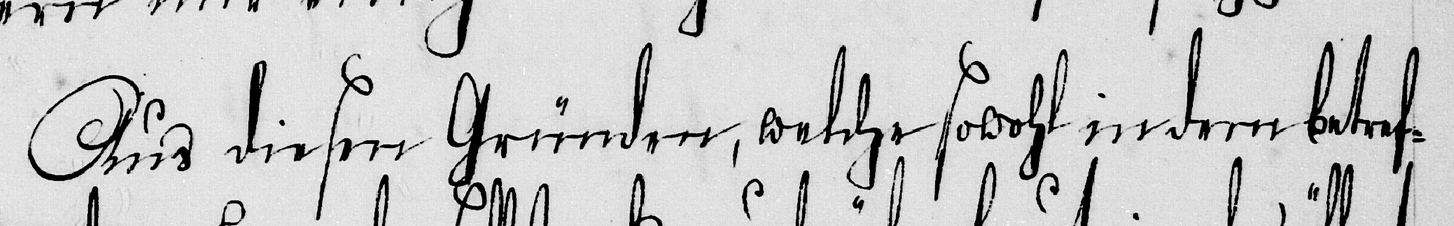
Aus diesen Gründen, welche sowohl in dem betre¬
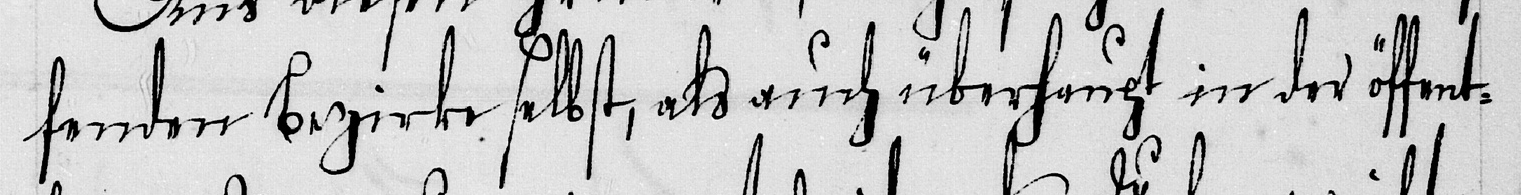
fenden Bezirke selbst, als auch überhaupt in der öffe¬
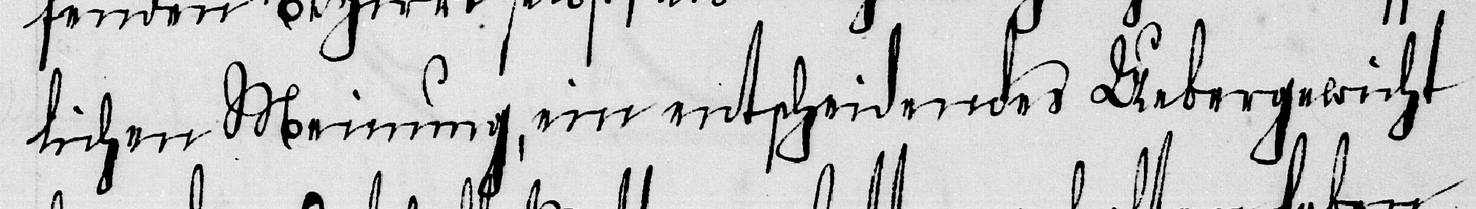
tlichen Meinung, ein entscheidendes Uebergewicht
